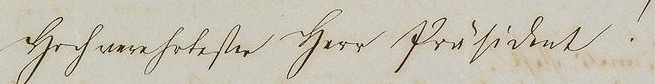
Hochverehrtester Herr Präsident!
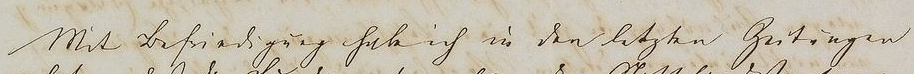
Mit Befriedigung habe ich in den letzten Zeitungen
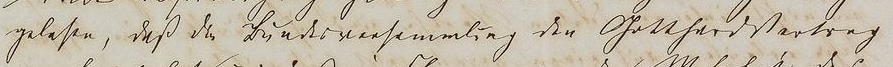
gelesen, daß die Bundesversammlung den GotthardVertrag
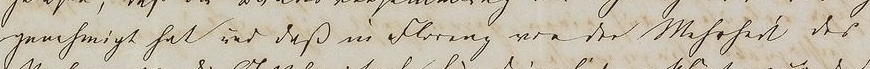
genehmigt hat und daß in Florenz von der Mehrheit des
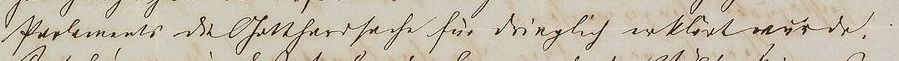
Parlaments die Gotthardsache für dringlich erklärt wurde.
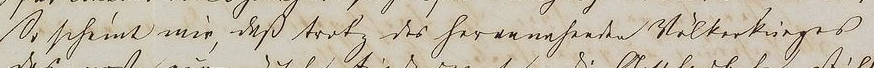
So scheint mir, daß trotz des herannahenden Völkerkrieges
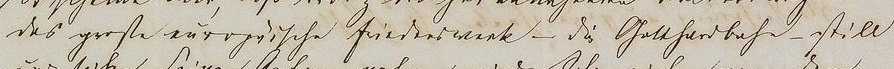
das große europäische Friedenswerk – die Gotthardbahn – still
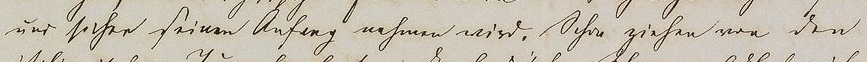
und sicher seinen Anfang nehmen wird. Schon ziehen von den
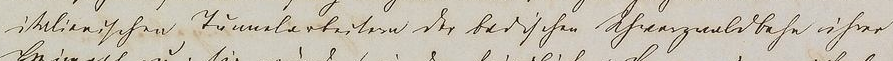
italienischen Tunnelarbeitern der badischenSchwarzwaldbahn ihrer
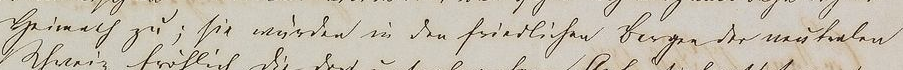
Heimath zu; sie würden in den friedlichen Bergen der neutralen
